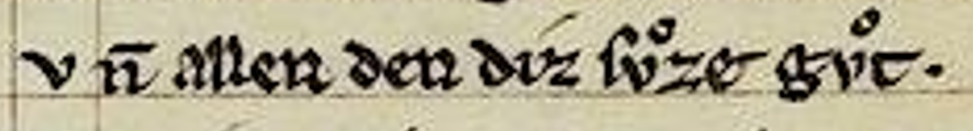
Vn(d) allen den diz ſv°oze gv°ot.
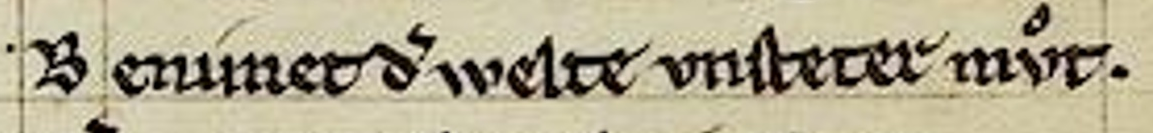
Benimet d(er) welte vnſteter mv°ot.
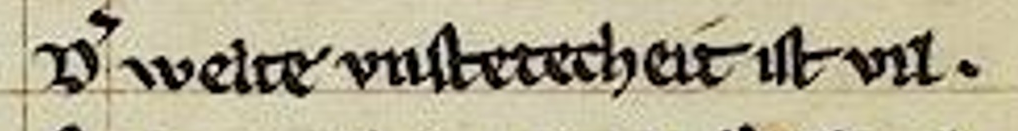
D(er) welte vnſtetecheit iſt vil.
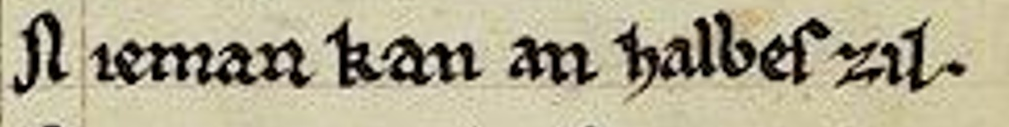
Nieman kan an halbeſ zil.
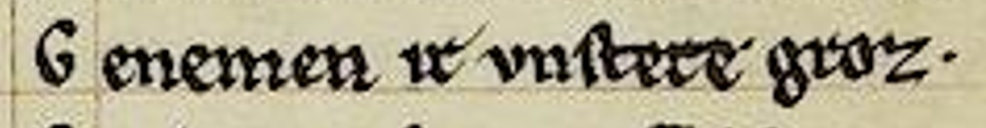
Genemen ir vnſtete groz.
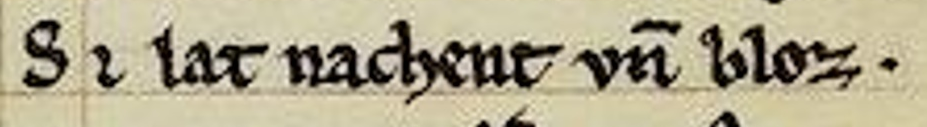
Si lat nachent vn(d) bloz.
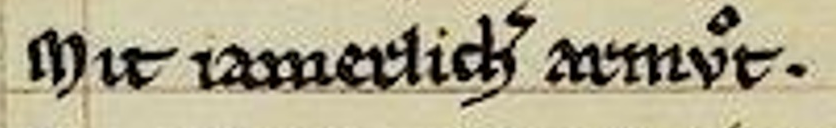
Mit iamerlich(er) armv°ot.
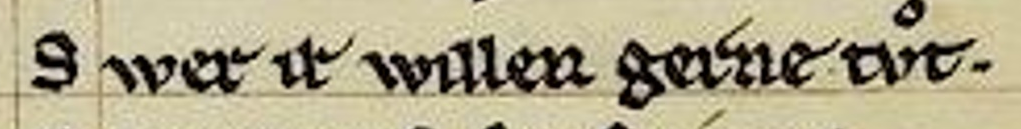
Swer ir willen gerne tv°ot.
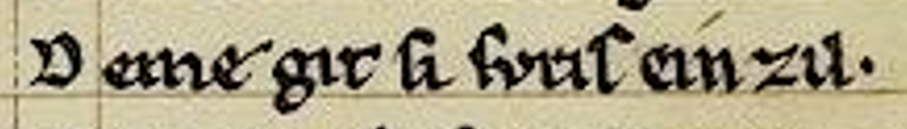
Deme git ſi ſvriſ ein zil.
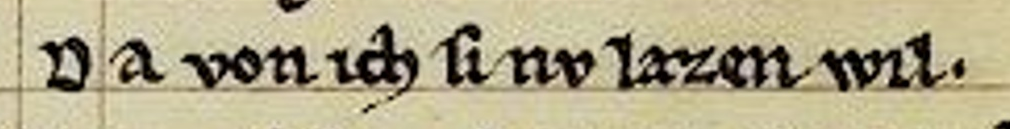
Da von ich ſi nv lazen wil.
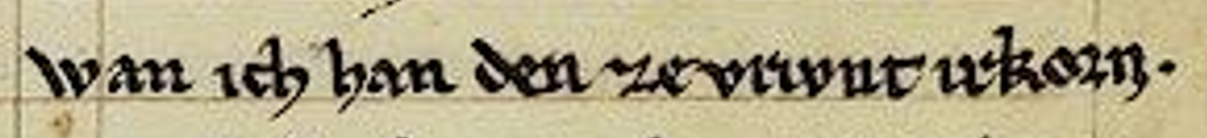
Wan ich han den ze vrivnt irkorn.
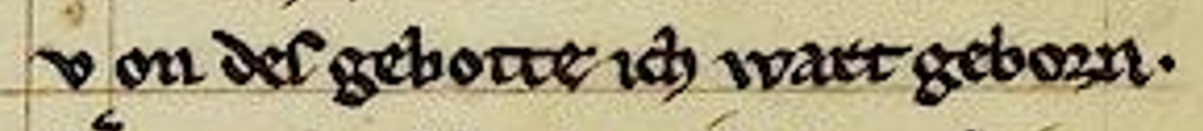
Von deſ gebotte ich wart geborn.
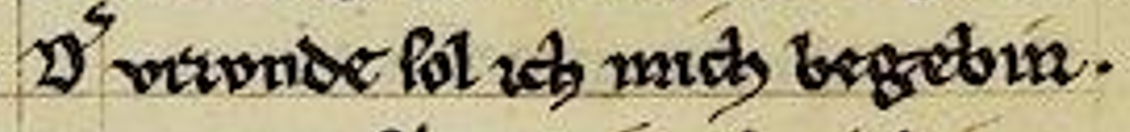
D(er) vrivnde ſol ich mich begebin.
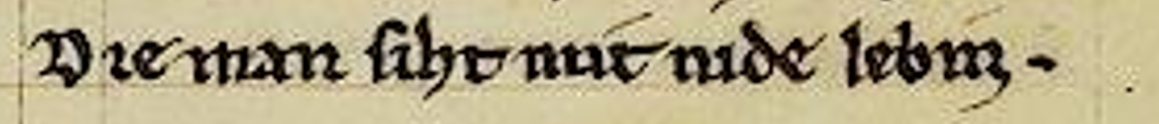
Die man ſiht mit nide lebin.
